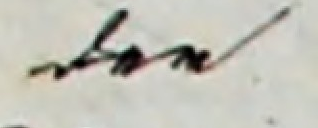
der
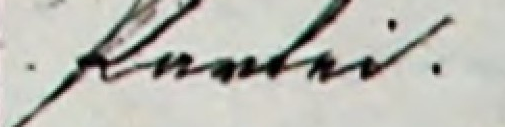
Partei.
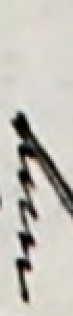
ung
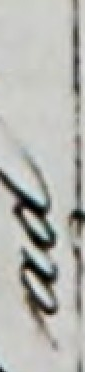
ad
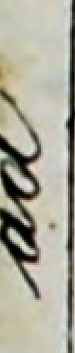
ad
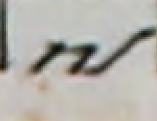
K.
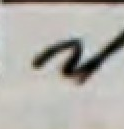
J.
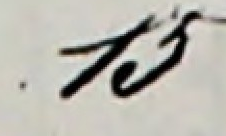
15
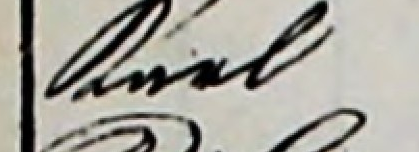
Karl
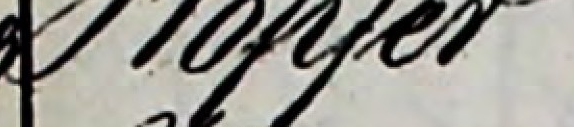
Hopfer
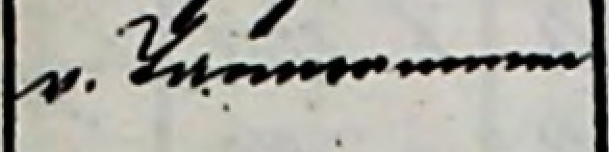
v. Tannenmann
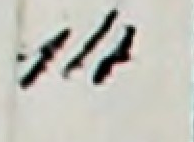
14
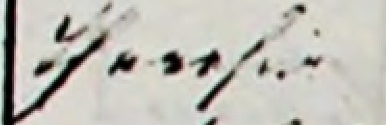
Theresia
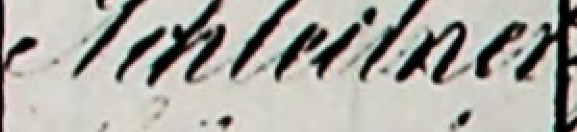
Kohleitner
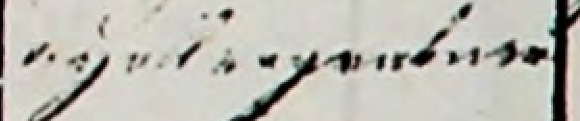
? Hellergartner
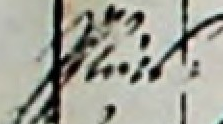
Fflinds„
